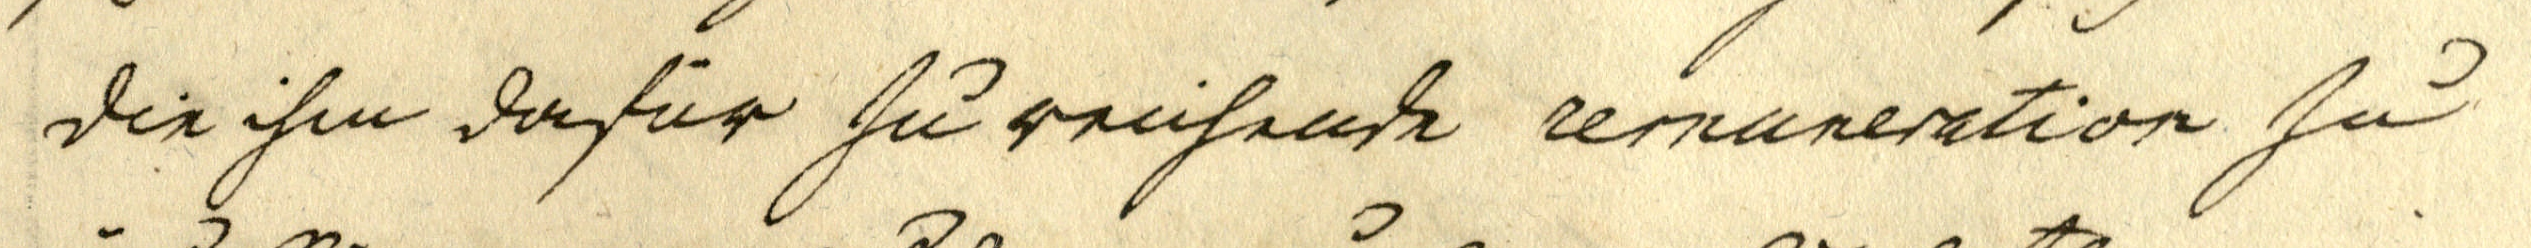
die ihm dafür zu reichende remuneration zu
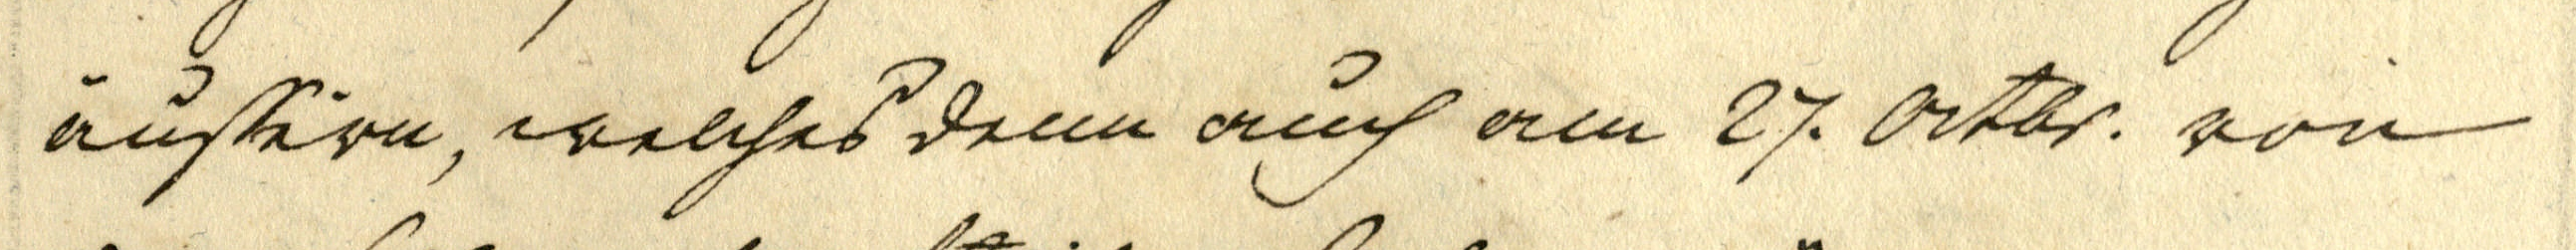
äussern, welches denn auch am 27. Octbr. von
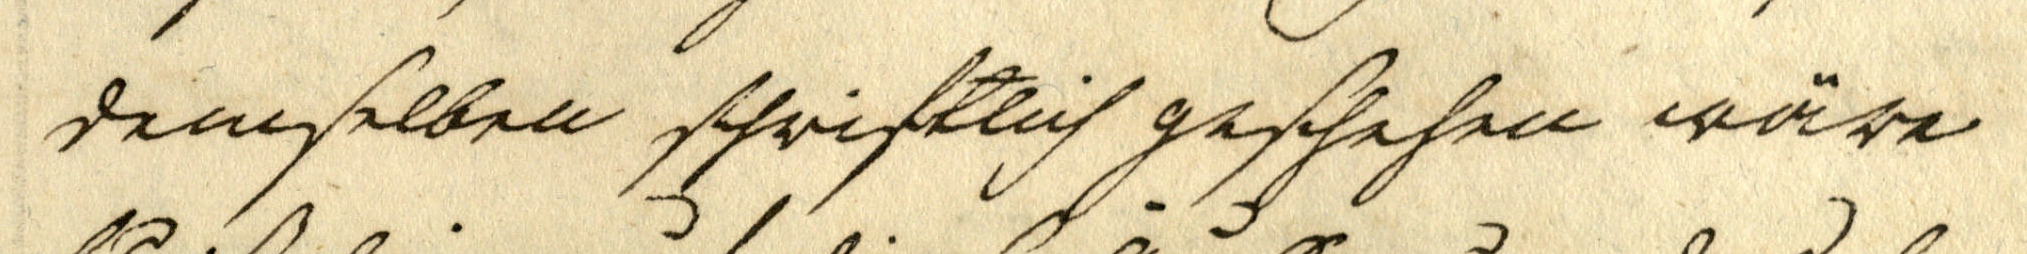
demselben schriftlich geschehen wäre.
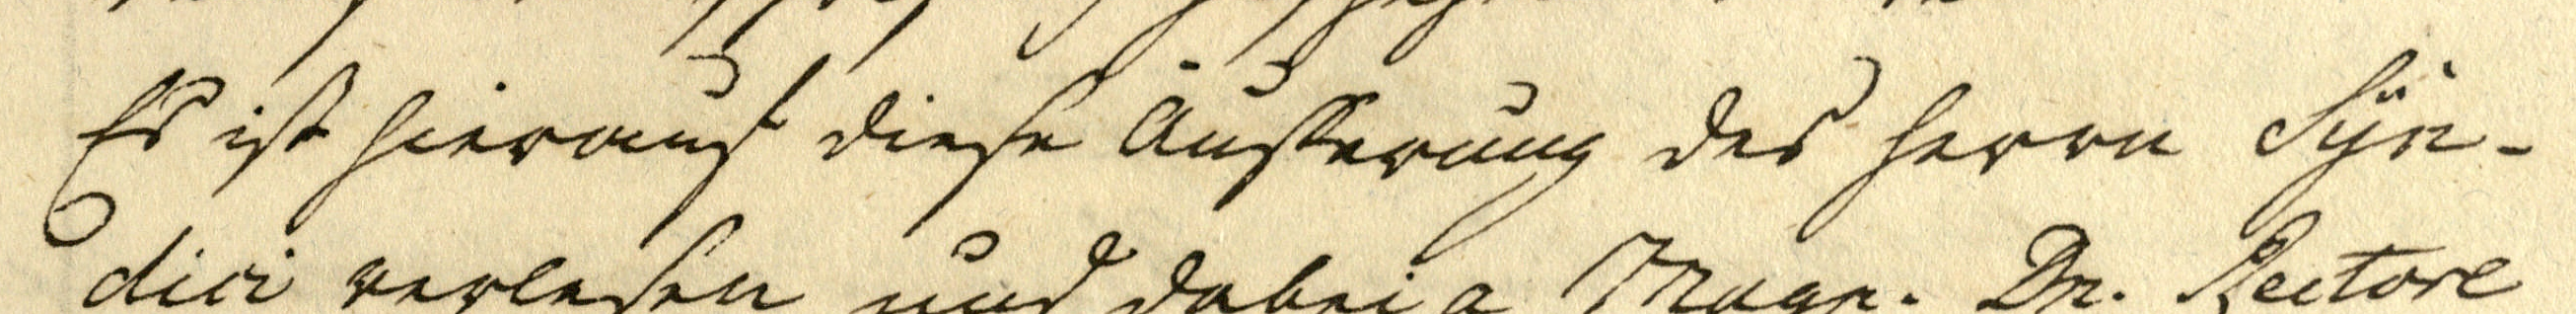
Es ist hierauf diese Äusserung des Herrn Sÿn¬
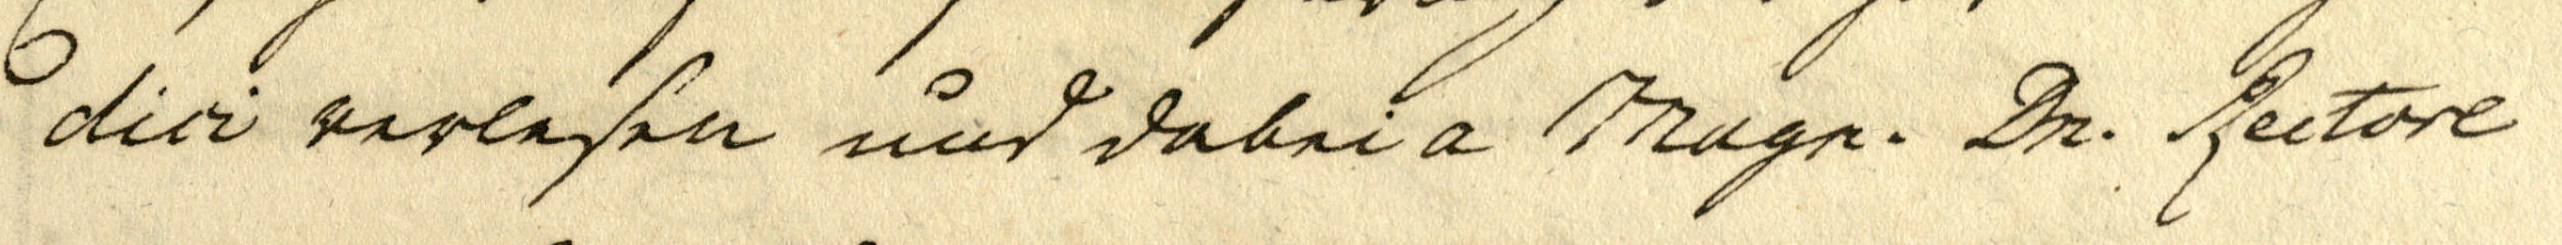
dici verlesen und dabei a Magn. Dn. Rectore
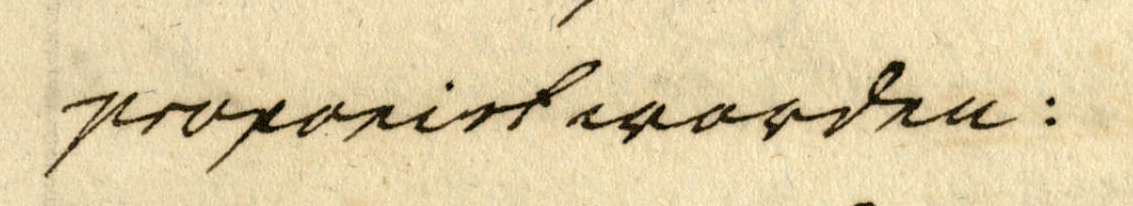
proponirt worden:
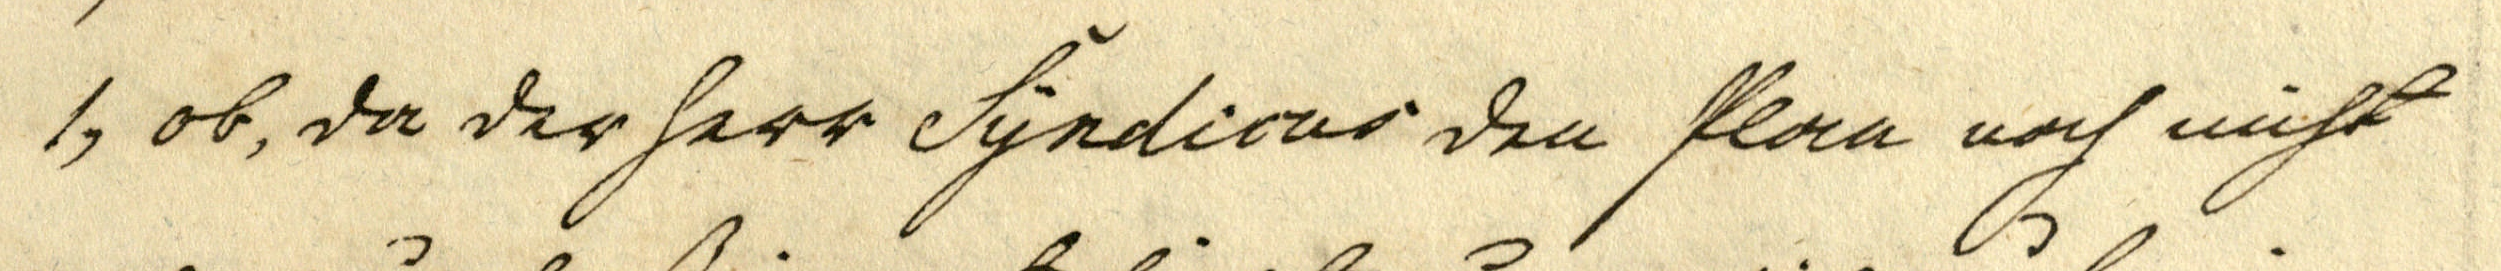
1., ob, da der Herr Sÿndicus den Plan noch nicht
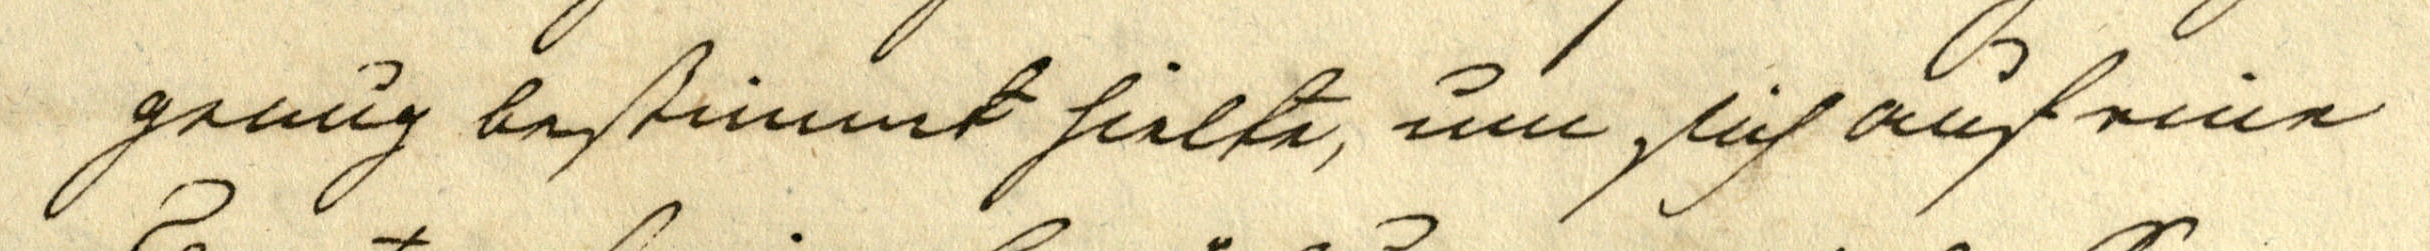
genug bestimmt hielte, im sich auf eine
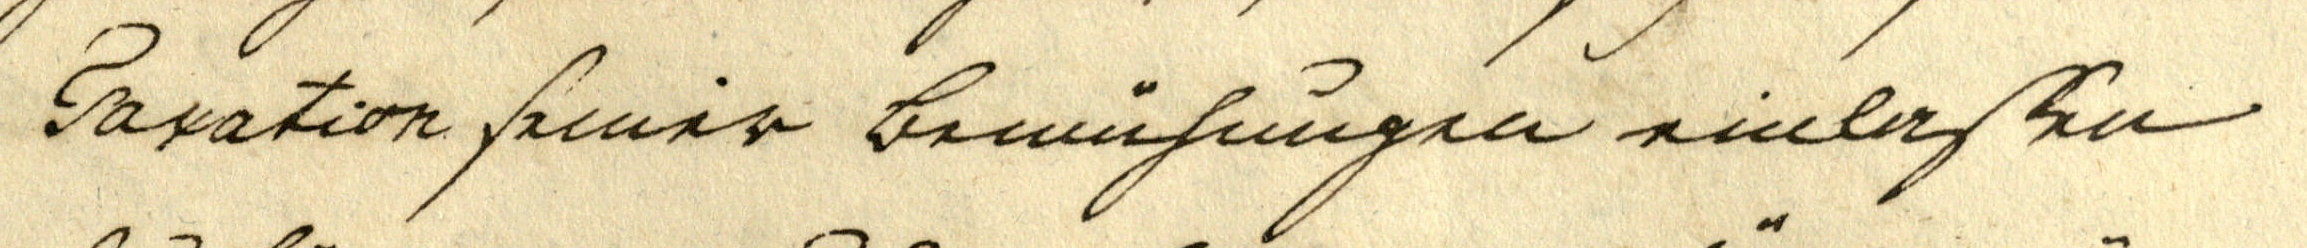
Taxation seiner Bemühungen einlassen
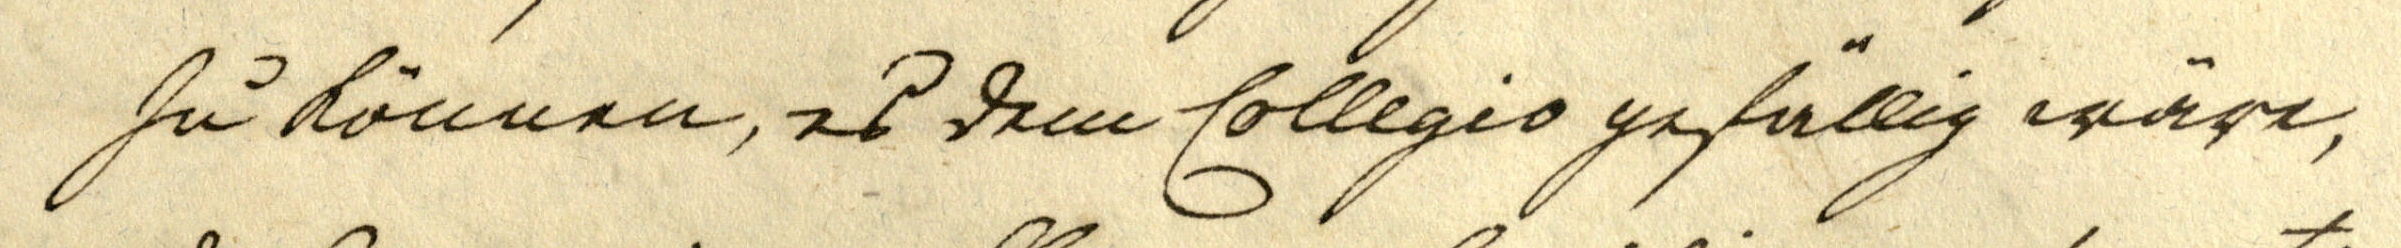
zu können, es dem Collegio gefällig wäre,
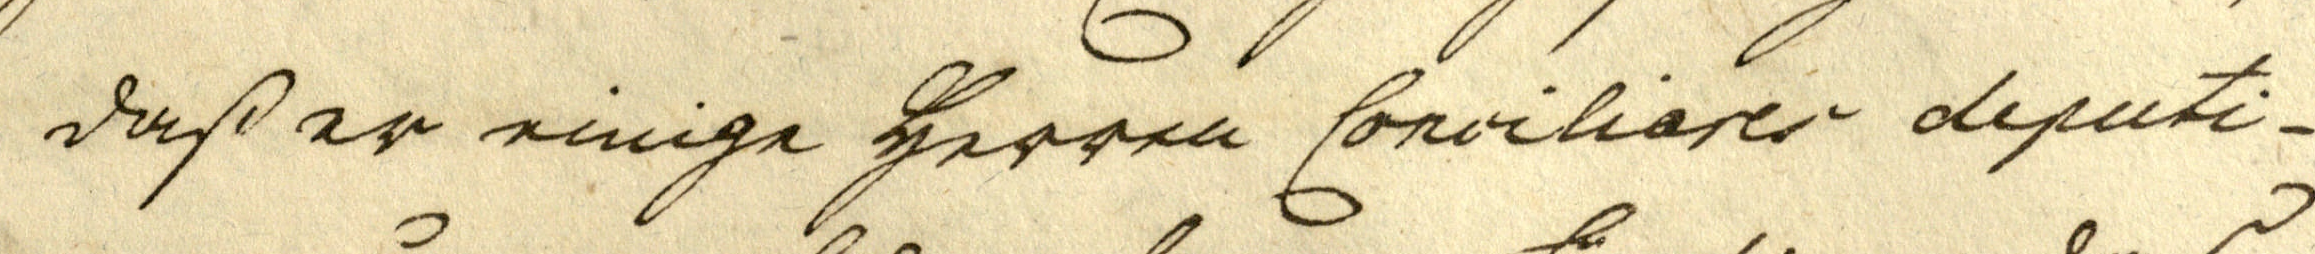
daß er einige Herren Conciliares deputi¬
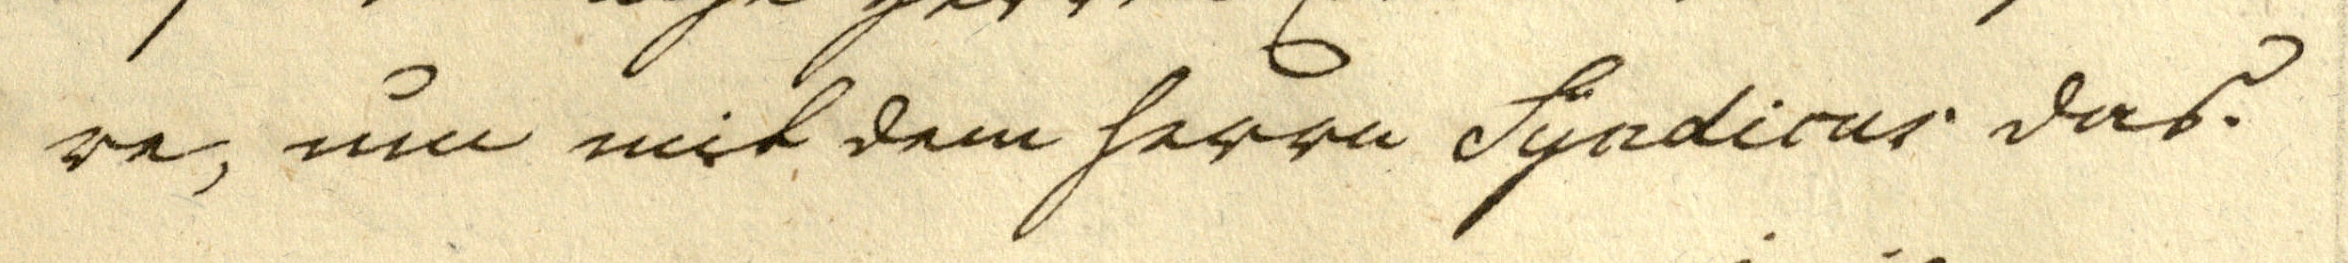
re, um mit dem Herrn Sÿndicus das¬
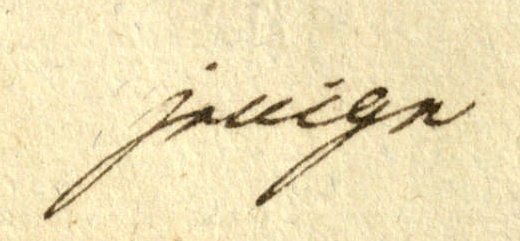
jenige
